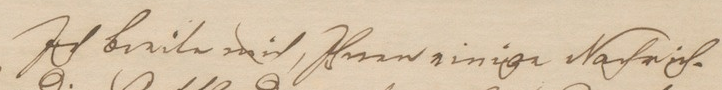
Ich beeile mich, Ihnen einige Nachrich-
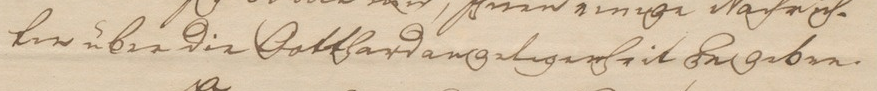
ten über die Gotthardangelegenheit zu geben.
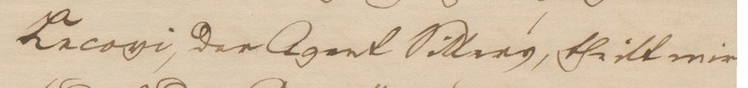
Cecovi, der Agent Sillar's, theilt mir
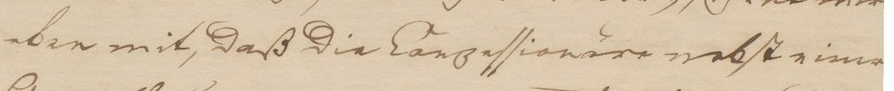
eben mit, daß die Conzessionäre nebst einer
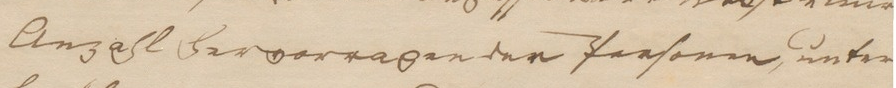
Anzahl hervorragender Personen, unter
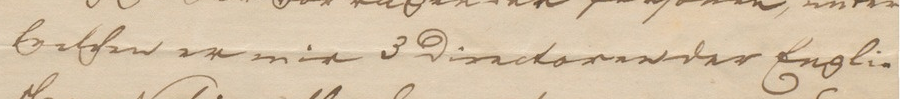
welchen er mir 3 Directoren der Engli-
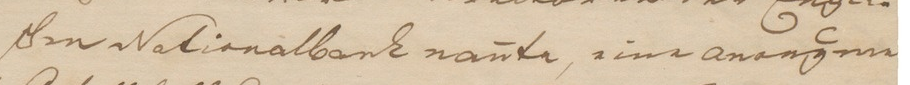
schen Nationalbank nannte, eine anonyme
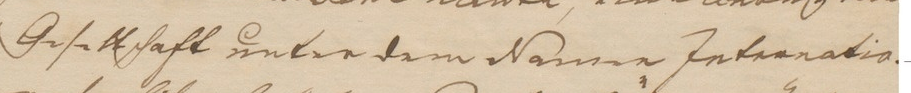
Gesellschaft unter dem Namen «Internatio-
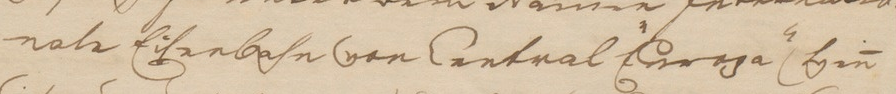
nale Eisenbahn von Central Europa» (wenn
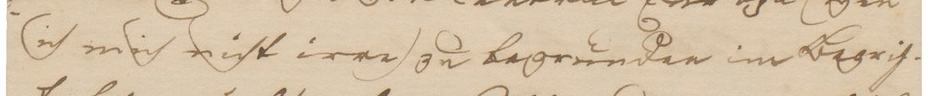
ich mich nicht irre) zu begründen im Begrif-
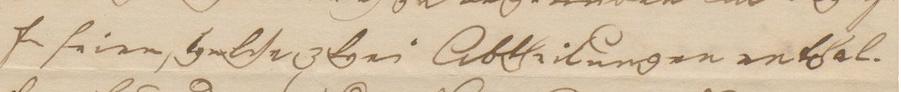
fe seien, welche zwei Abtheilungen enthal-
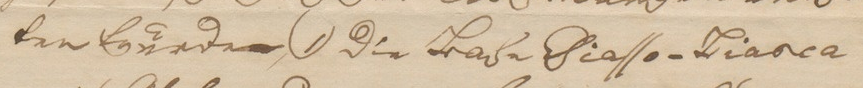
ten würden, 1) die Bahn Chiasso–Biasca
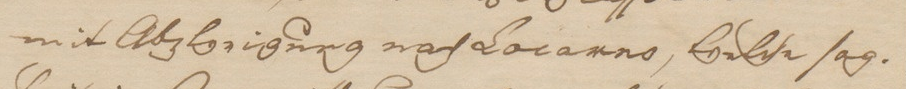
mit Abzweigung nach Locarno, welche sog-
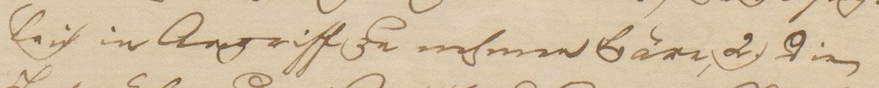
leich in Angriff zu nehmen wäre, 2) die
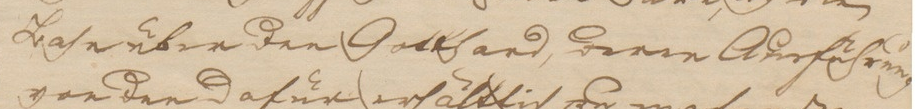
Bahn über den Gotthard, deren Ausführung
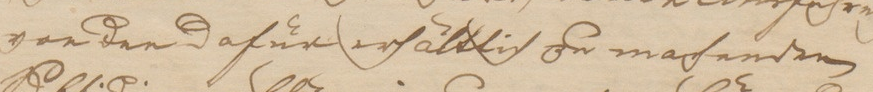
von den dafür erhältlich zu machenden
